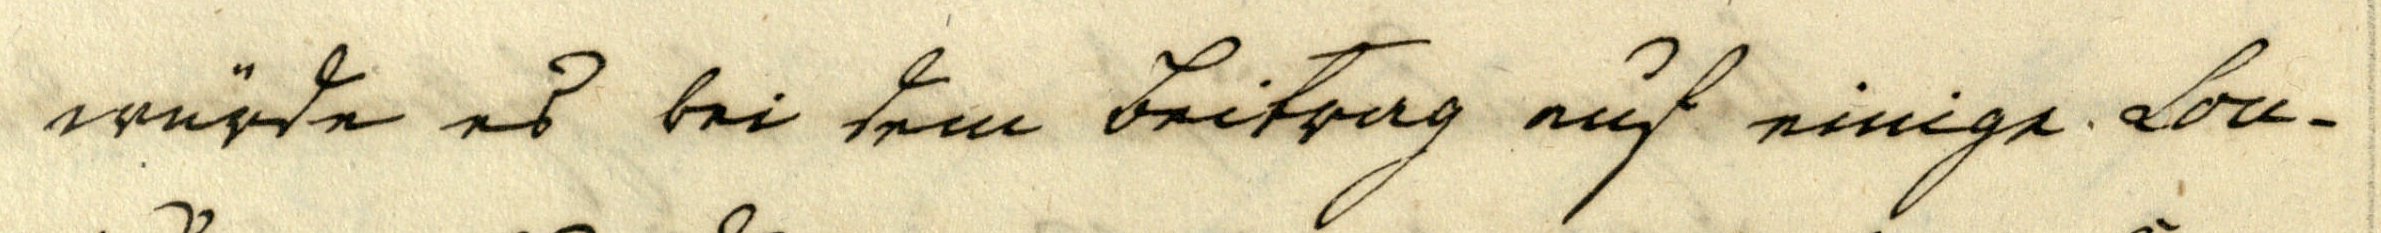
würde es bei dem Beitrag auf einige Lou-
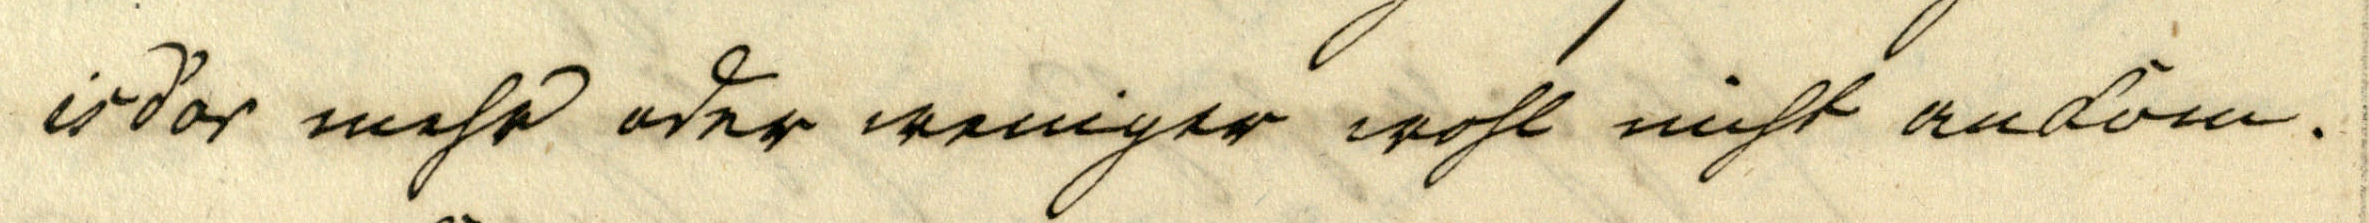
isdor mehr oder weniger wohl nicht ankom-
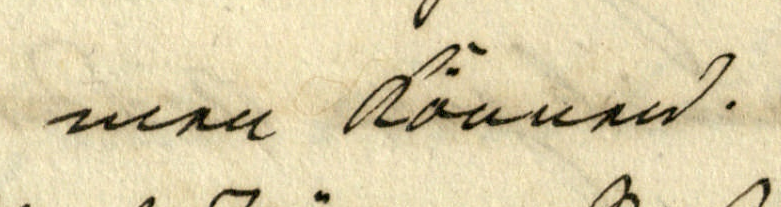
men können.
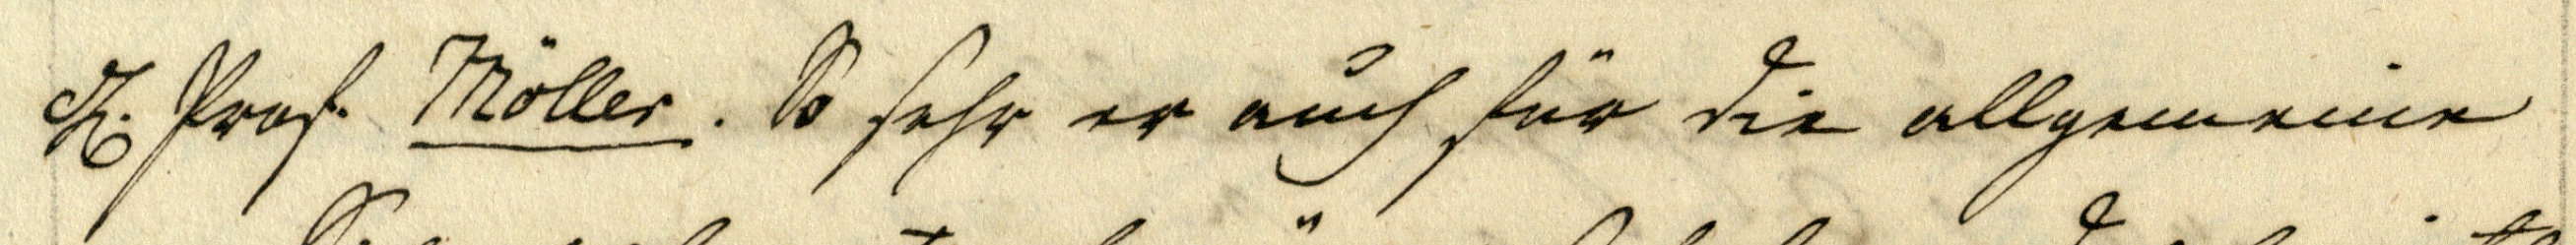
dh. Prof. Möller. So sehr er auch für die allgemeine
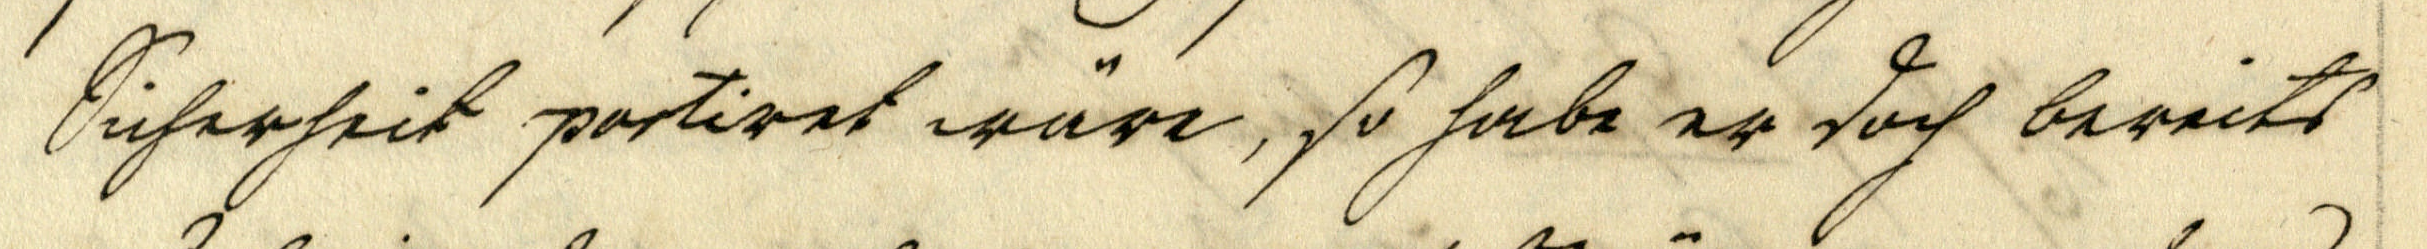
Sicherheit portiret wäre, so habe er doch bereits
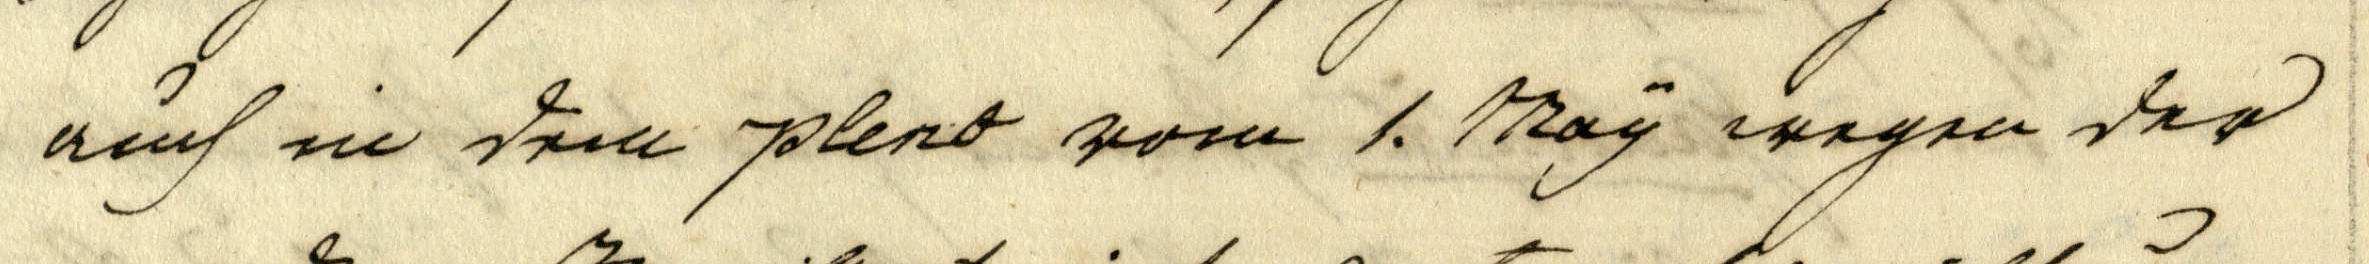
auch in dem pleno vom 1. May wegen der
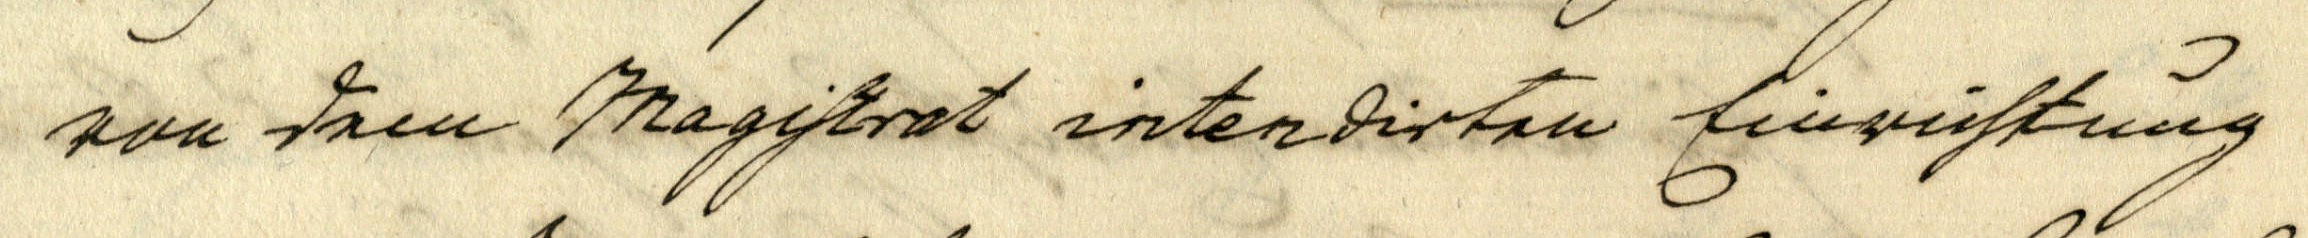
von dem Magistrat intendirten Einrichtung
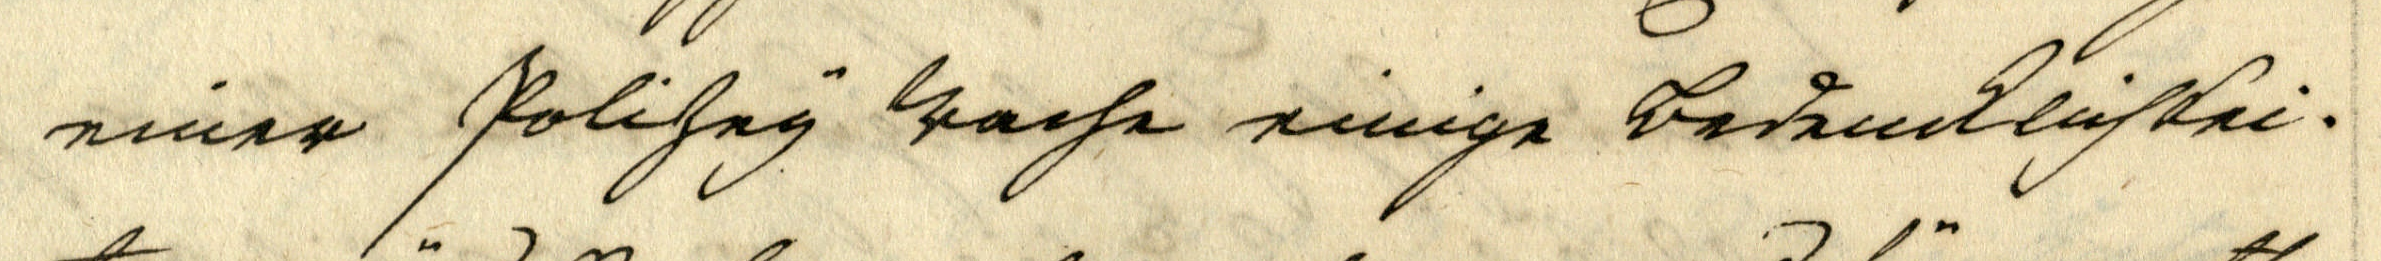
einer Polizey Wache einige Bedencklichkei-
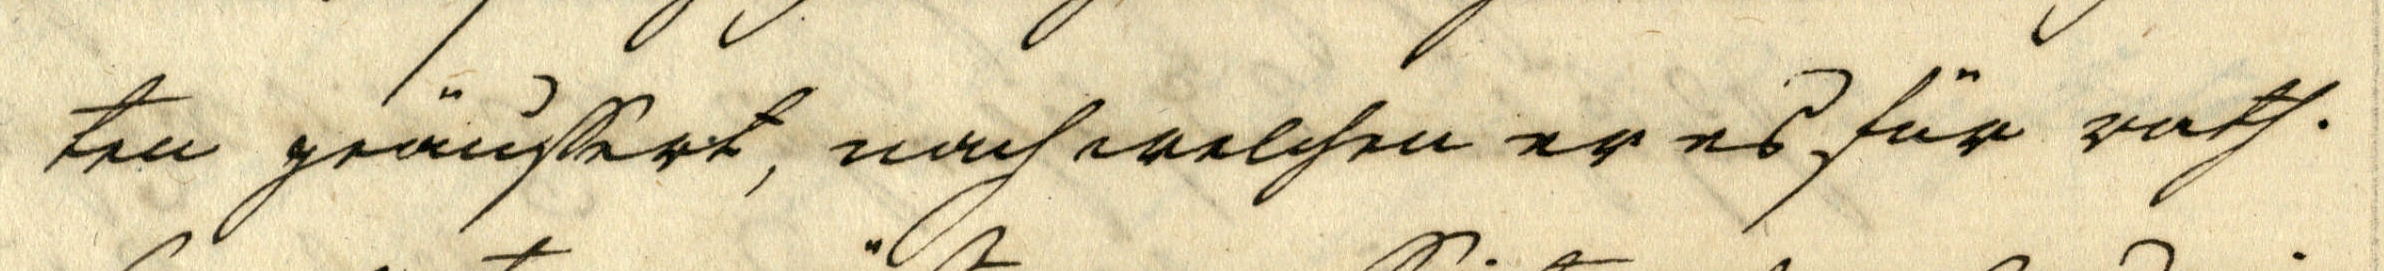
ten geäussert, nach welchen er es für rath-
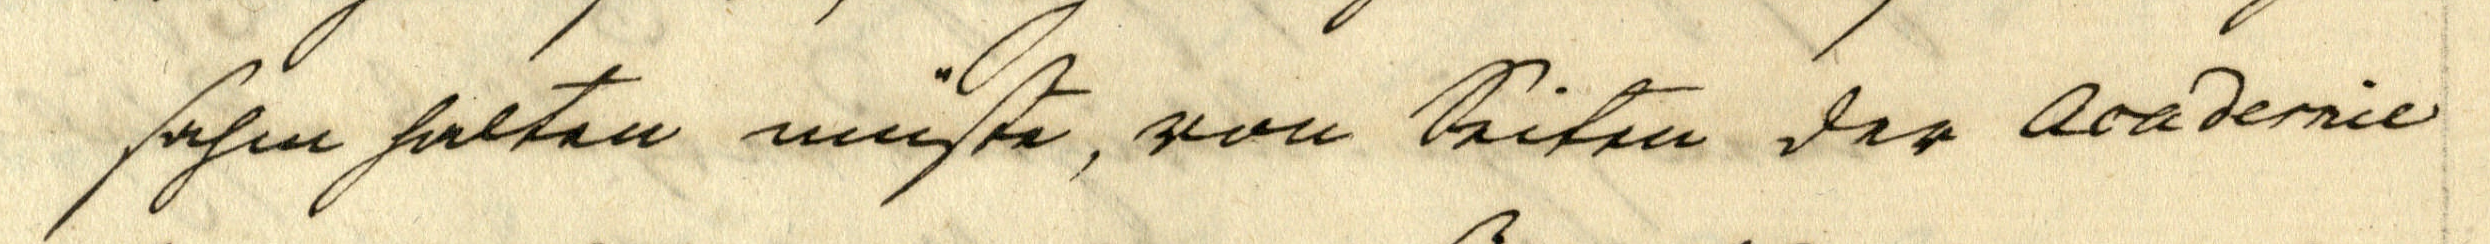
sahm halten müßte, von Seiten der Academie
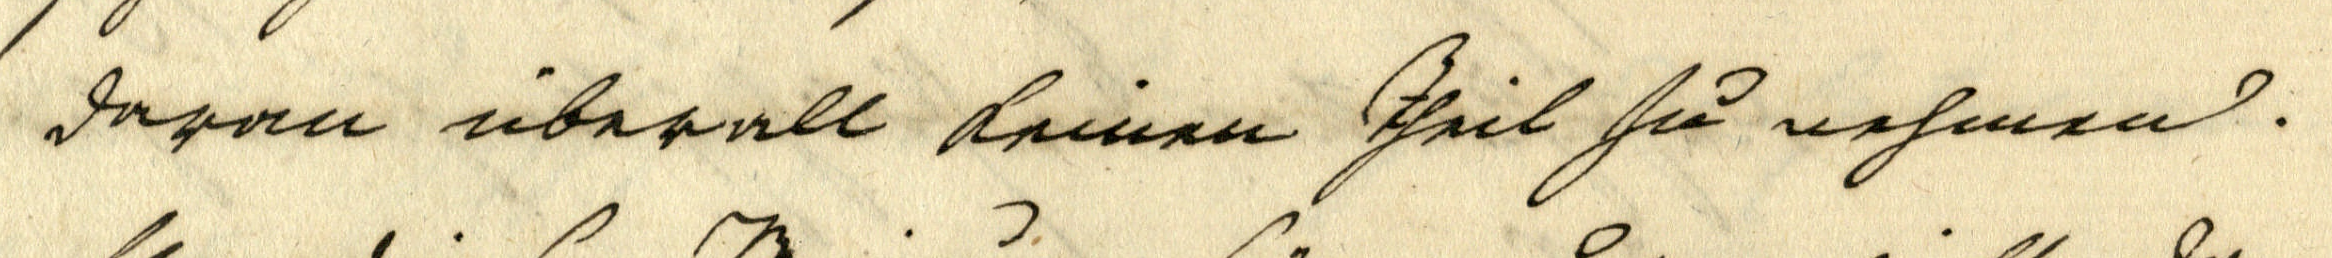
daran überall keinen Theil zu nehmen.
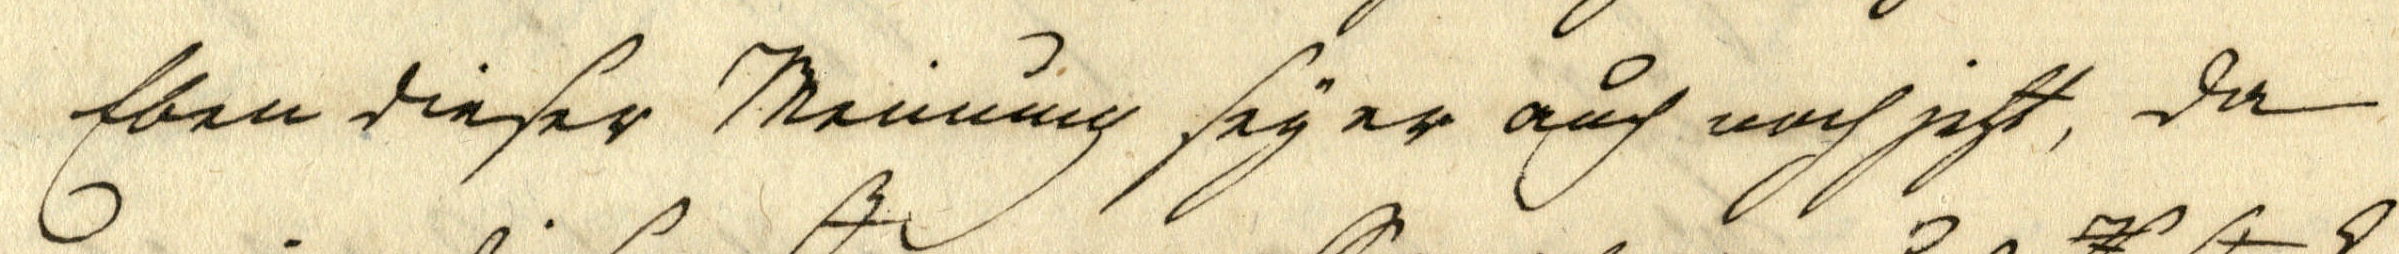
Eben dieser Meinung sey er auch noch jetzt, da
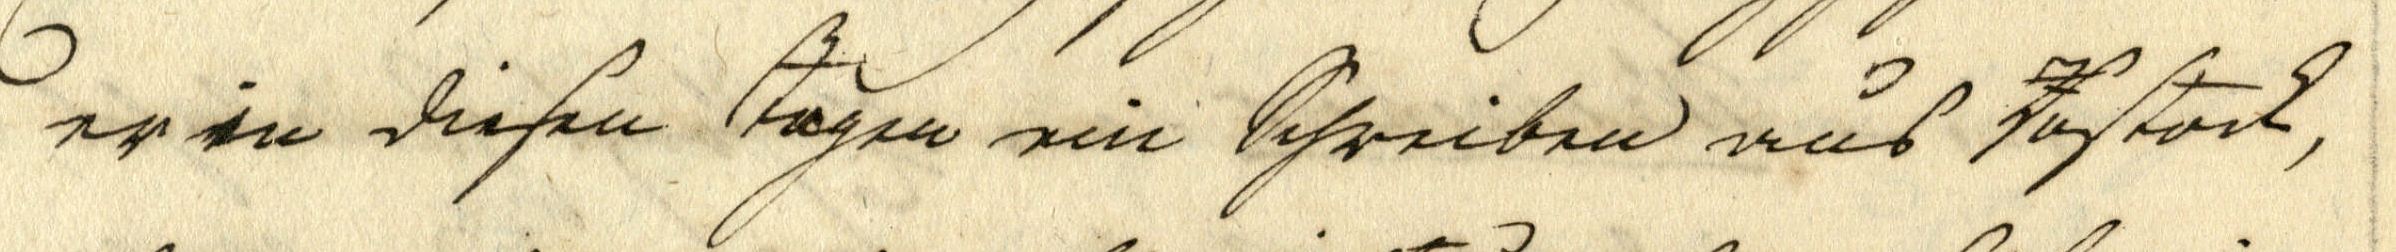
er in diesen Tagen ein Schreiben aus Rostock,
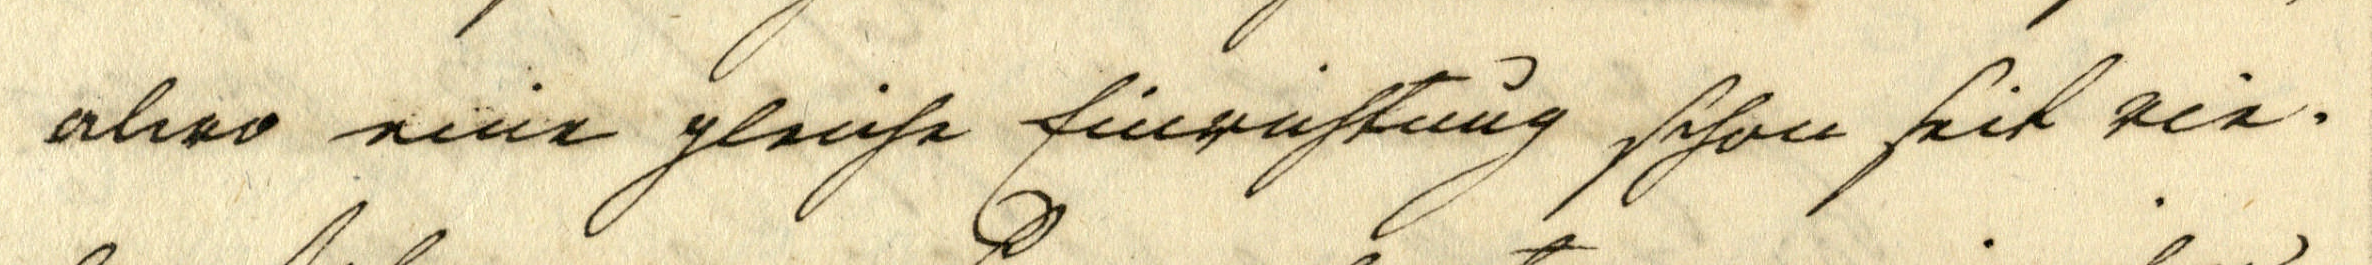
alwo eine gleiche Einrichtung schon seit vie-
